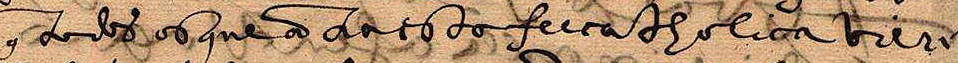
q̄ todos os que cōtra esta fee catholica vierē
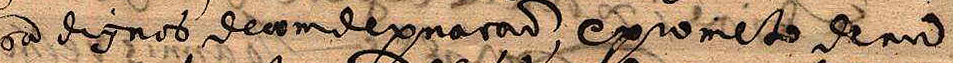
sā dignos de comdepnaçaõ, e prometo de nū
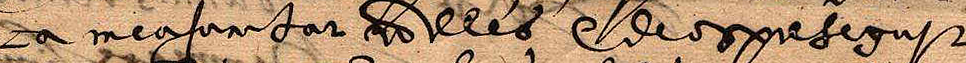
ca me aJumtar cō elles e de os presegujr
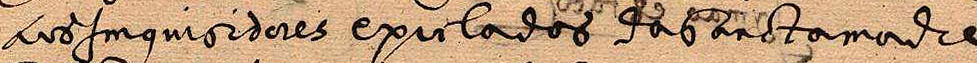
aos Jmquisidores e prelados da sancta madre
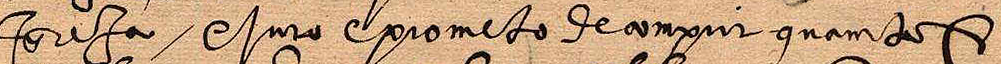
JgreJa / e Juro e prometo de comprir quamto ē
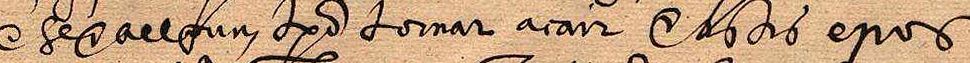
e se ē allgum tpō tornar a cair ē estes erros
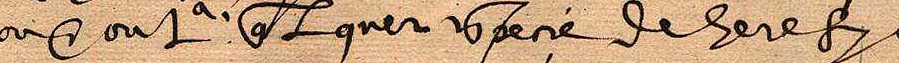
ou ē outa q̄Lquer espeçie de heresja
